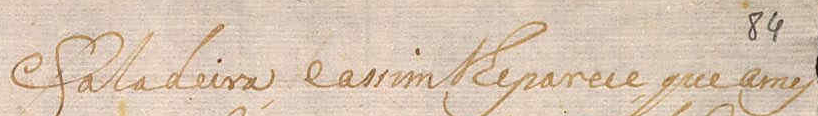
e faladeira, e assim lhe parece, que a mes
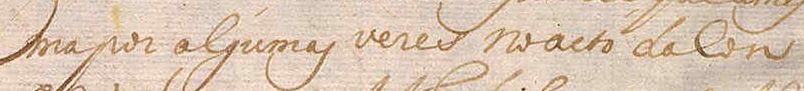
ma por algumas vezes no acto da Con
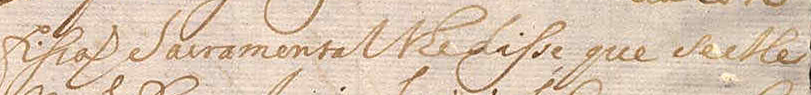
fissaõ Sacramental lhe disse, que se elle
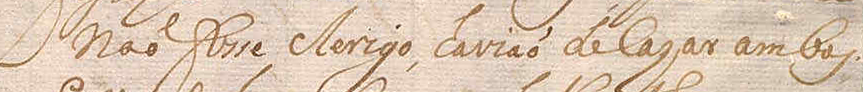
naõ fosse clerigo, haviaõ de Cazar ambos
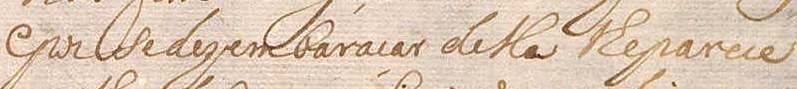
e por se dezembaraçar della lhe parece
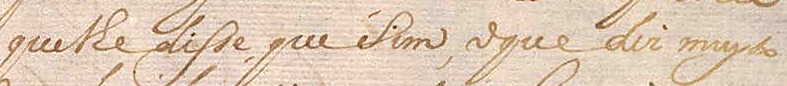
que lhe disse, que sim, o que diz muyto
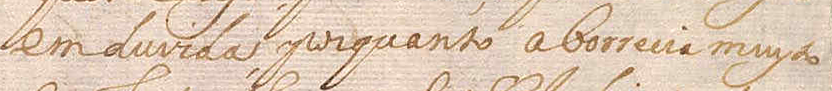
em duvida, porquanto aborrecia muyto
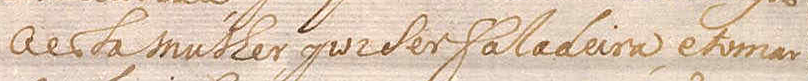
a esta mulher, por ser faladeira, e tomar
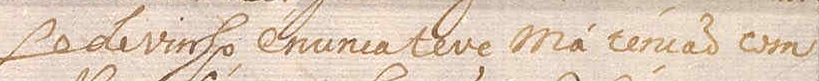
se de vinho, e nunca teve má tençaõ com
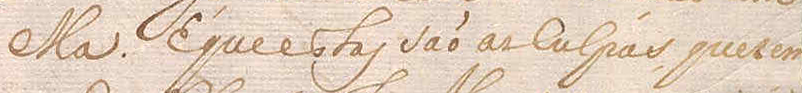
ella. E que estas saõ as culpas que tem
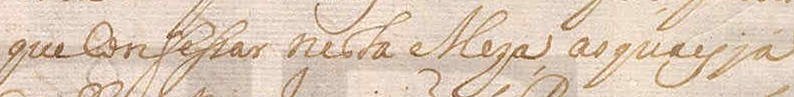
que confessar nesta Meza, as quaes ja
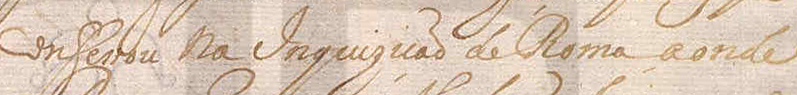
confessou na Inquiziçaõ de Roma, aonde
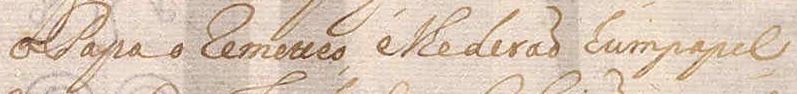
o Papa o Remetteo, e lhe deraõ hum papel,
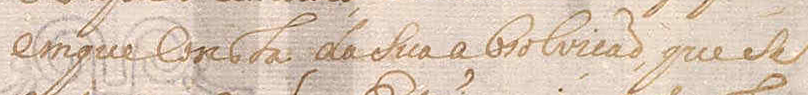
em que consta da sua absolviçaõ, que Se
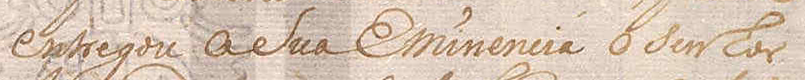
entregou a Sua Emīnencia o senhor
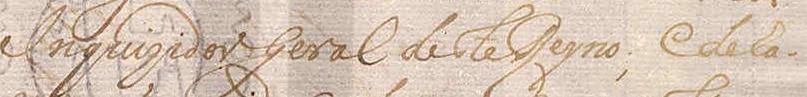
Inquizidor Geral deste Reyno; E dela
